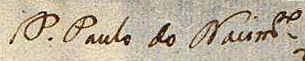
o P. Paulo do Nacim.to
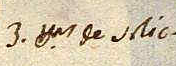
3. tt.as de solic.
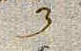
3
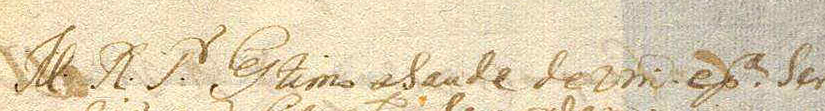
M. R. s.r Estimo a saude de v m. e p.a ser
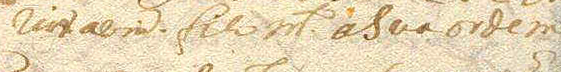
vir a vm. fico m.to a sua ordem
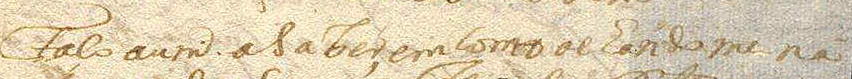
Faço a u m. a saber, em como achandome na
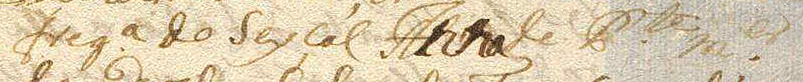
freg.a do Seyçal Anna de P.te m.er
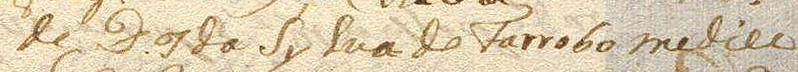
de D.os da Sylva do Farrobo me dice
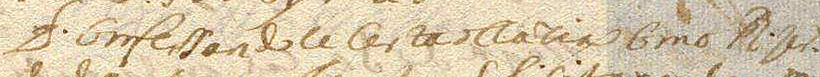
q̄. confessandoce certa occaziaꝭ com o R. vr.
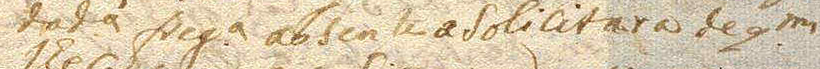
da d.a freg.a absente a solicitara de q.m
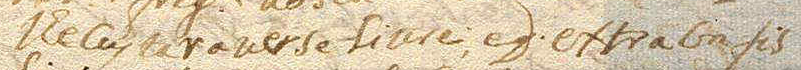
lhe custara verse livre; e q̄ extra confis
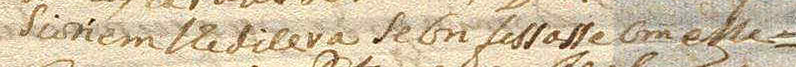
sionem lhe dicera se confessasse com elle
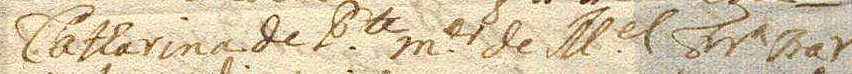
Catharina de Pt.e m.er de M.el Frr.a Bar
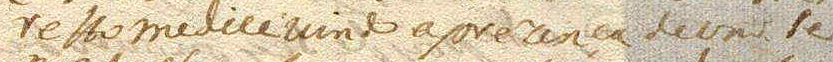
retto me dice uindo a prezença de vm se
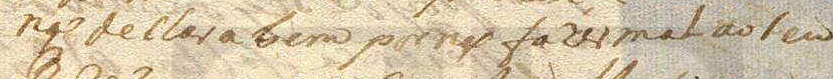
naꝭ declara bem por naꝭ fazer mal ao seu
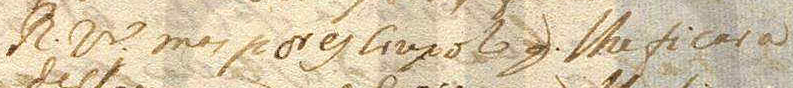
R. Vr. mas por escrupolo q̄. lhe ficara
